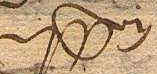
esp̄vy
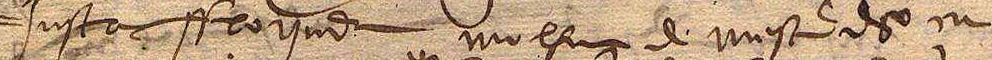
item Justa fflorjnda molher de mest̄ djo çu
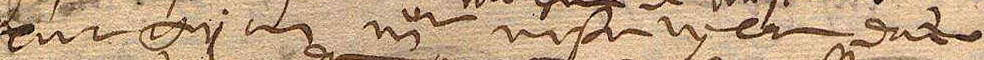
lurgyam mor nesta vyla dauro
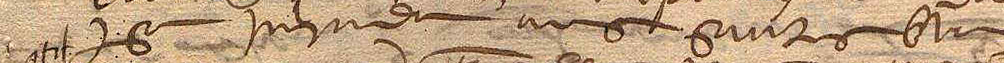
tsa Jurada aos santos evam
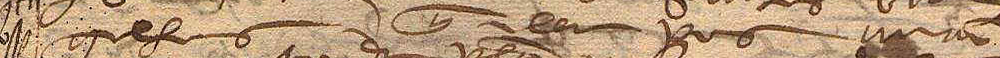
gelhos ē q̄ ella pos a maõ
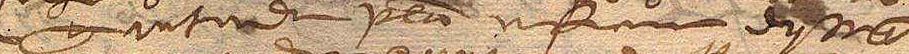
ꝑguntada pl̄lo custume dyse q̄
